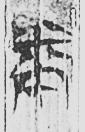㡀
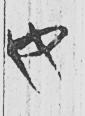女
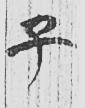子
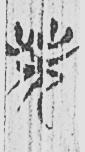{艹犬}
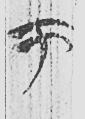于
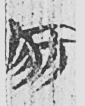房
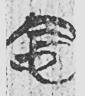𠁩
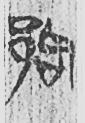邭
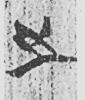之
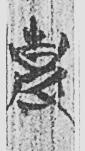尅
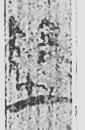{降土}
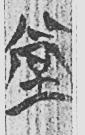堂
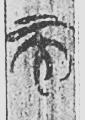而
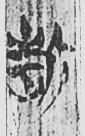折
